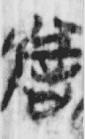儋
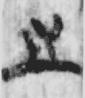之
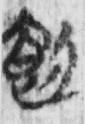○（食）
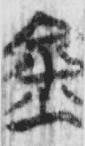金
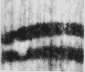二
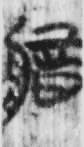𨟻（將）
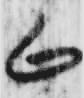㠯（以）
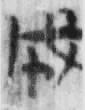成
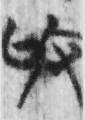收
